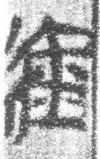○（錦）
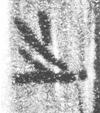之
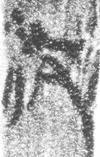○（鞶）
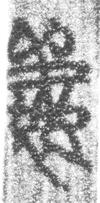襄（囊）
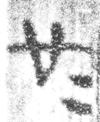廿
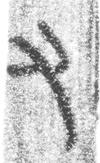又
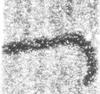一
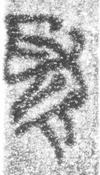緅
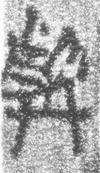與
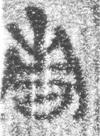青
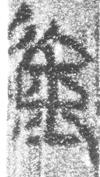○（錦）
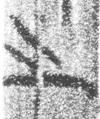之
